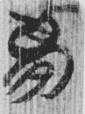夢
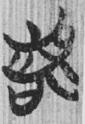若
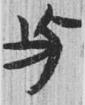此
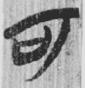可（何）
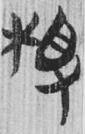○（相）
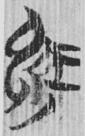○（徙）
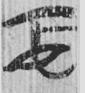𠁩
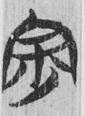余（舍）
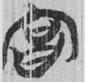○（答）
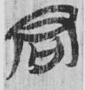君
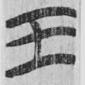王
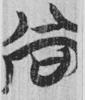尚（當）
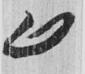㠯（以）
